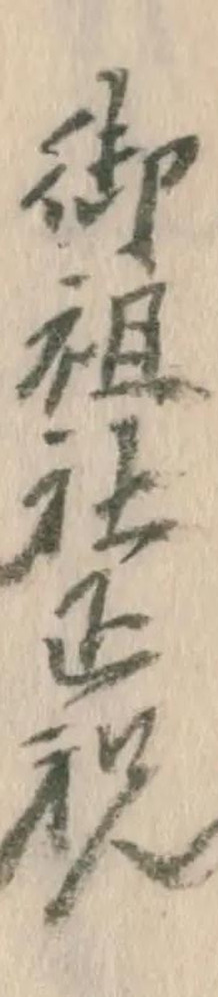御祖社正祝
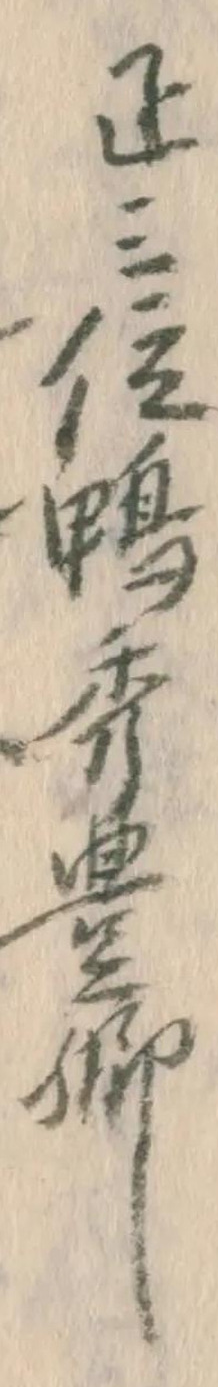正三位鴨秀豊卿
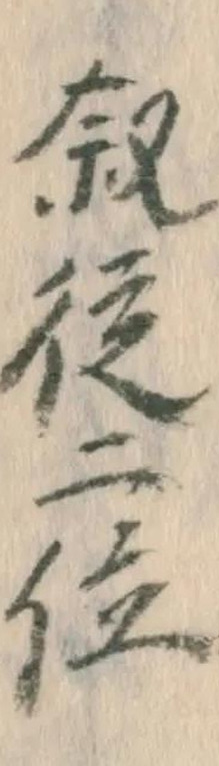叙従二位
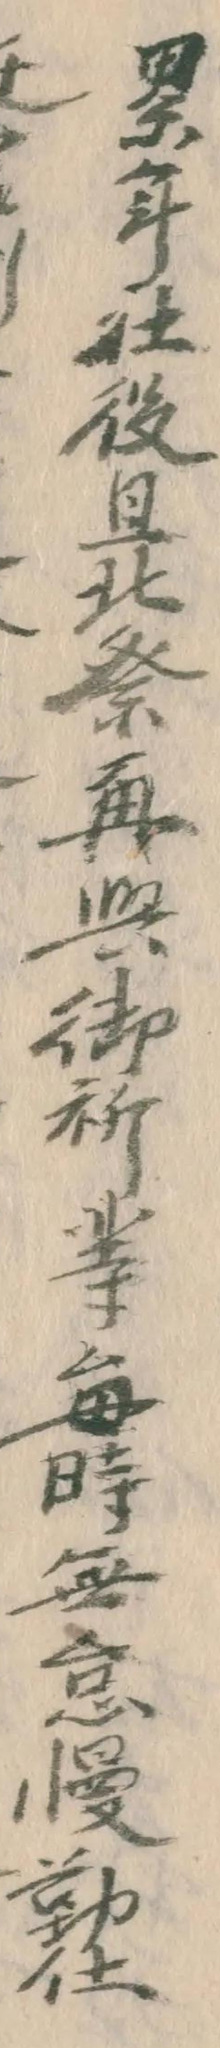累年社役且北祭再興御祈等毎時無怠慢勤仕
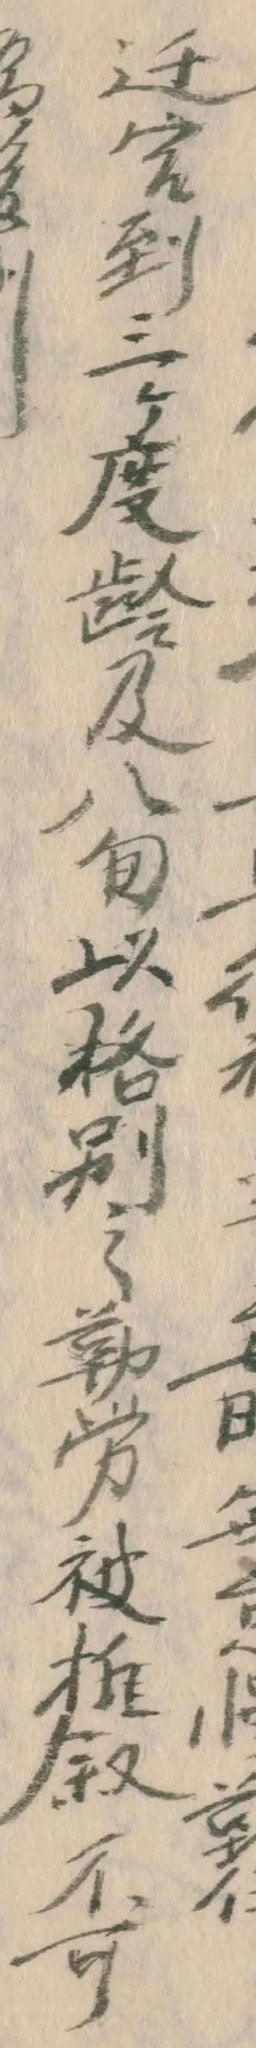遷宮到三ケ度齢及八旬以格別之勤労被推叙不可
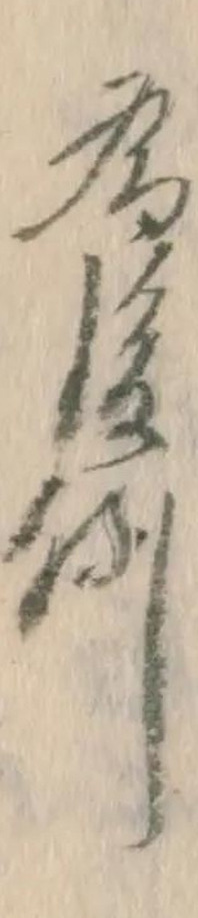為後例
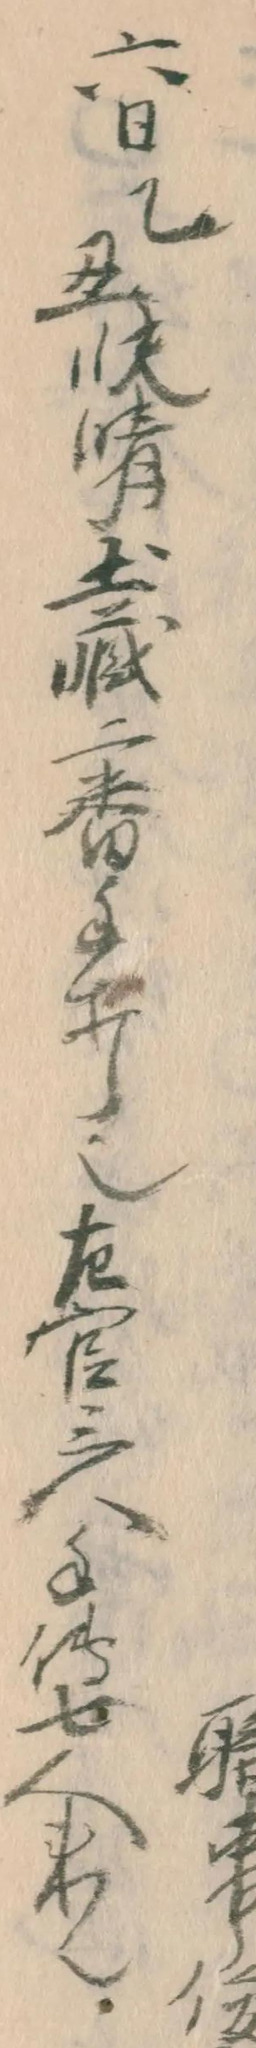六日乙丑快晴土蔵二番手打也左官三人手傳七人来也
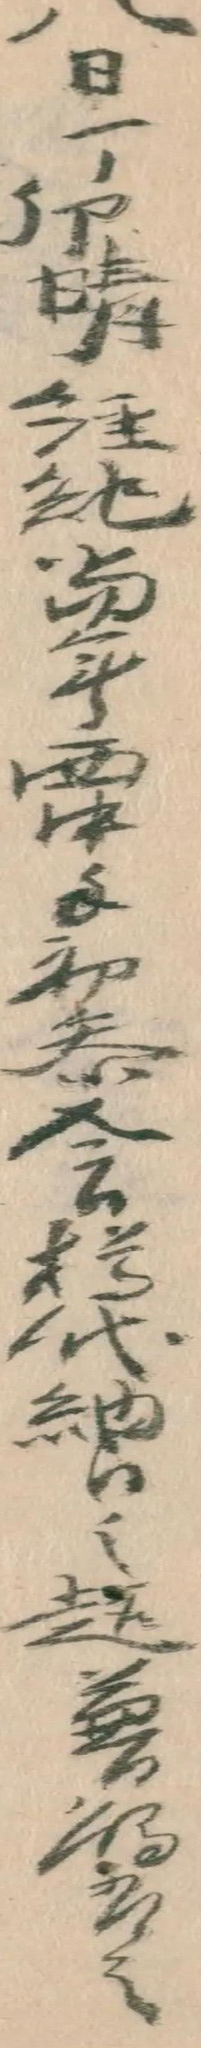八日丁卯晴経紀當年西中手初参今日樽代納候之趣兼而觸有之
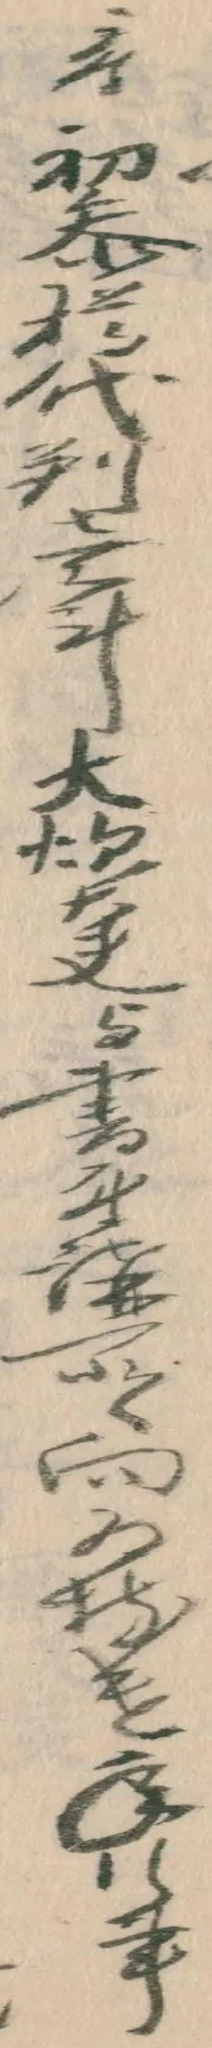ニ付初参樽代判壱斗大炊大夫と書付講所へ向為持遣年行事
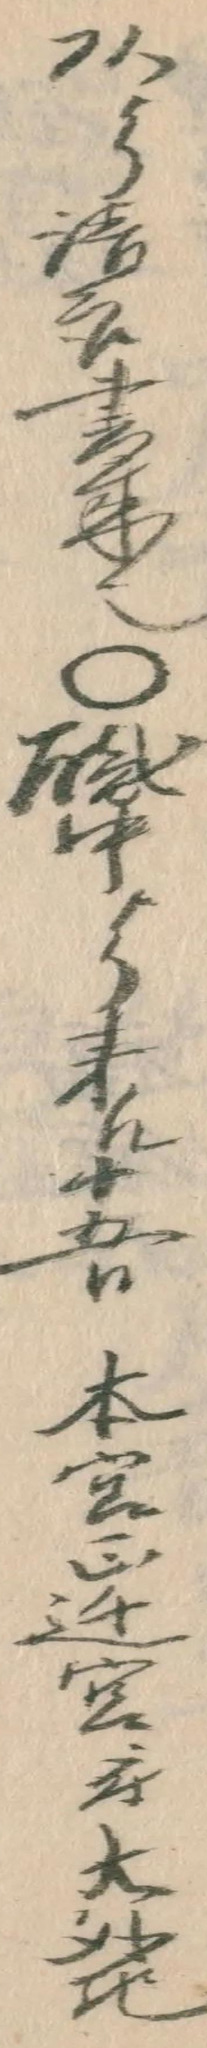頭より請取書来之○職中より来ル十五日本宮正遷宮ニ付大外記
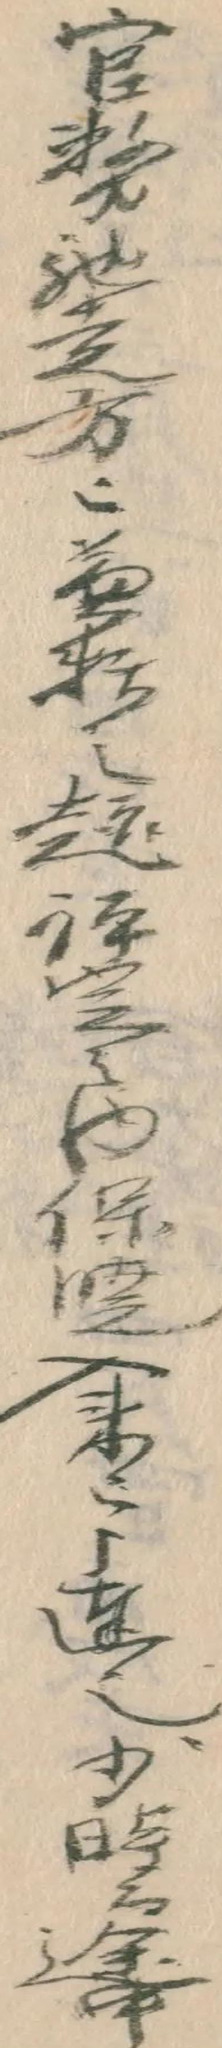官務馳走方被兼頼之趣評定之内保竪入来被申達也少時而途中
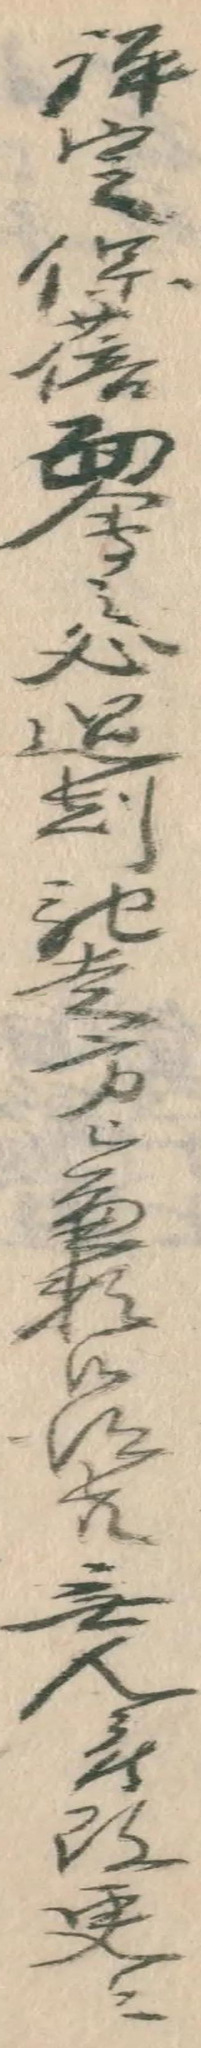評定保蓓面會之処過刻馳走方被兼頼候得共無人ニ付改更ニ
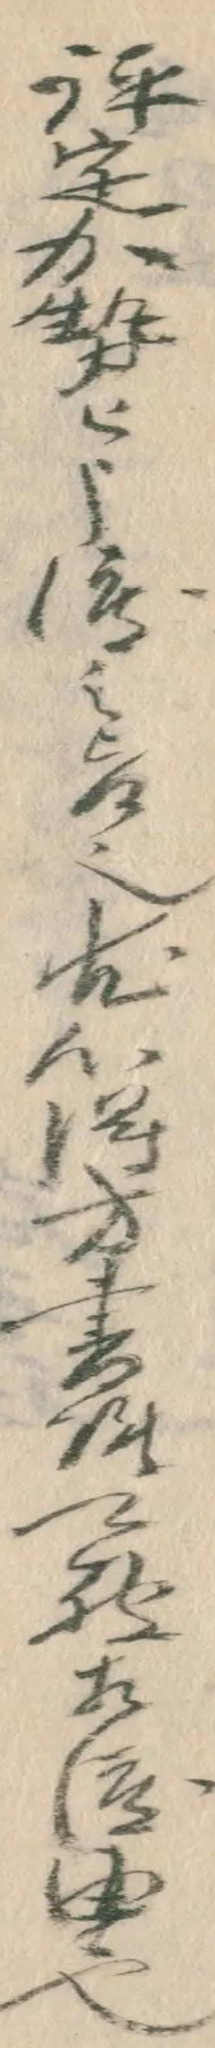評定加勢被申渡之旨也尤心得方書附可致相渡由也
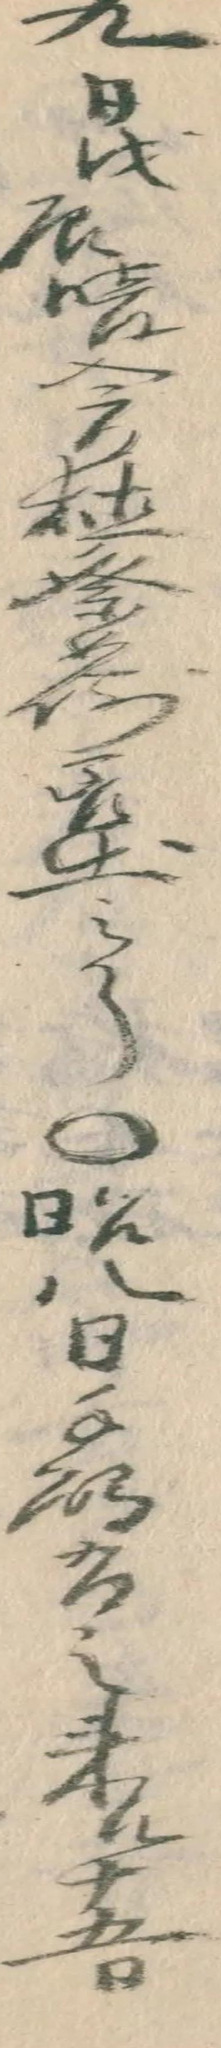九日戊辰晴今日植祭如例差出之了○昨八日手觸有之来ル十五日
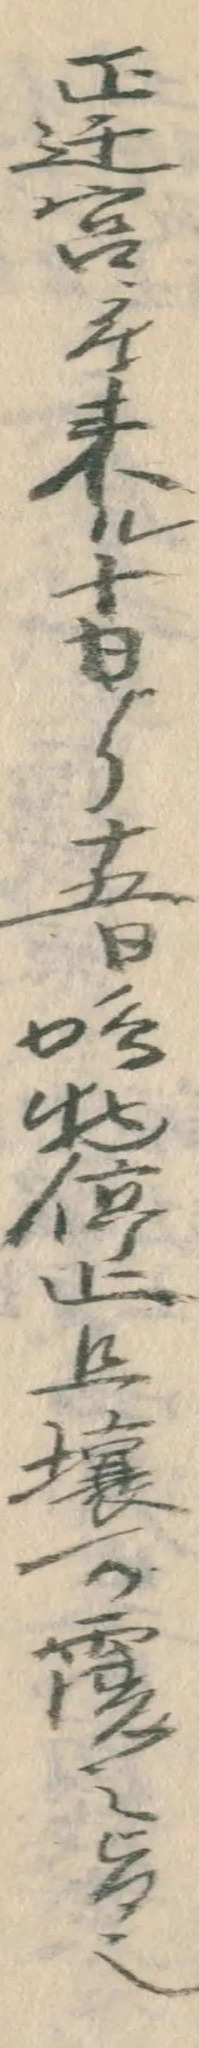正遷宮ニ付来ル十日より十五日鳴物停止且壌可覆之旨也
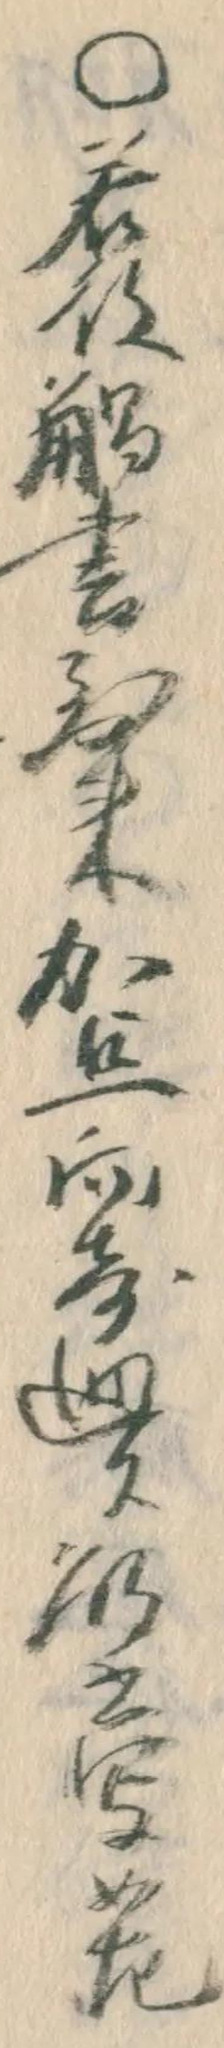○若殿触書到来加点向寄廻ス觸書写如左
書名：賀茂社記録. 第67冊
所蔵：国立国会図書館 National Diet Library, JAPAN
